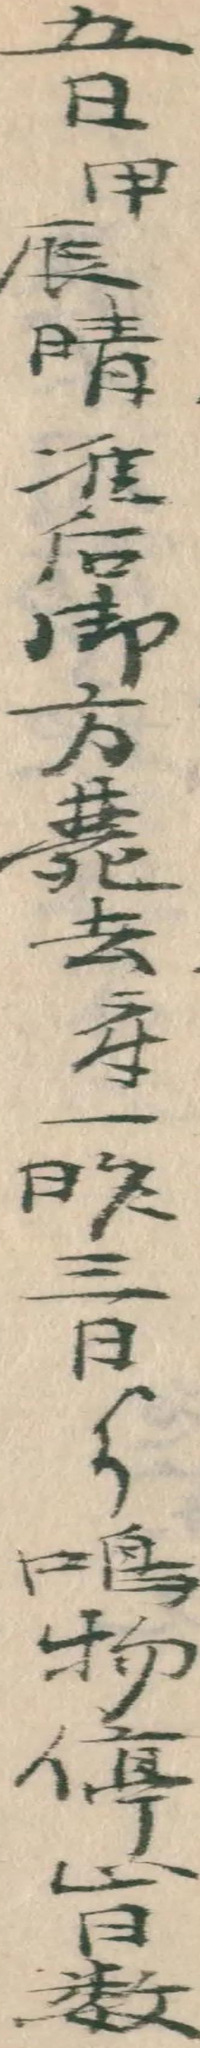五日甲辰晴准后御方薨御ニ付一昨三日より鳴物停止日数
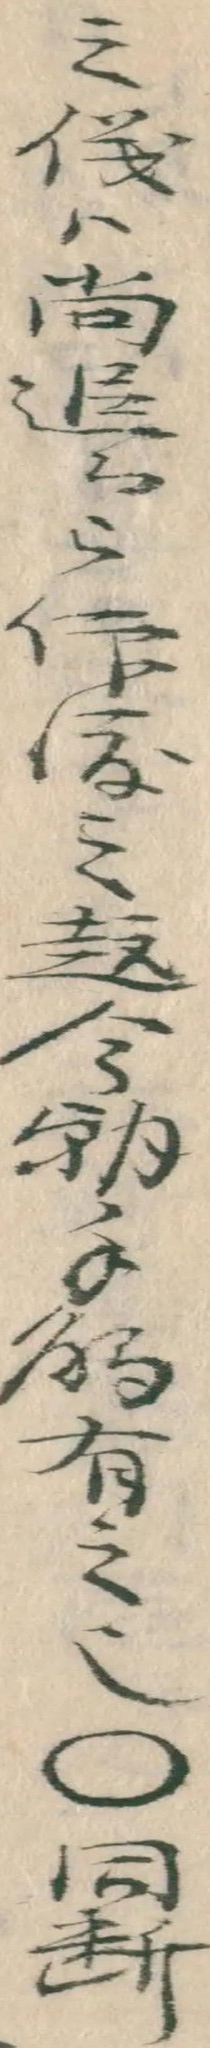之儀ハ尚追而被仰渡之趣今朝手触有之也〇同断
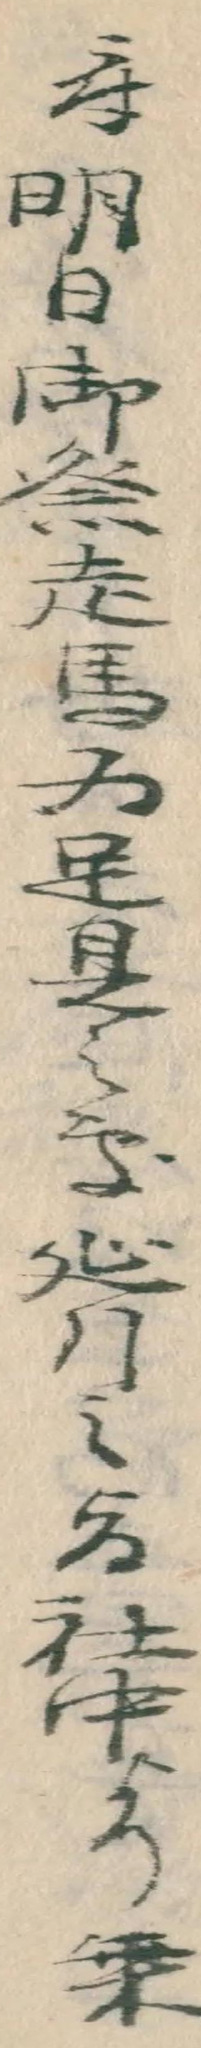ニ付明日御祭走馬為足見之処延引之旨社中より乗
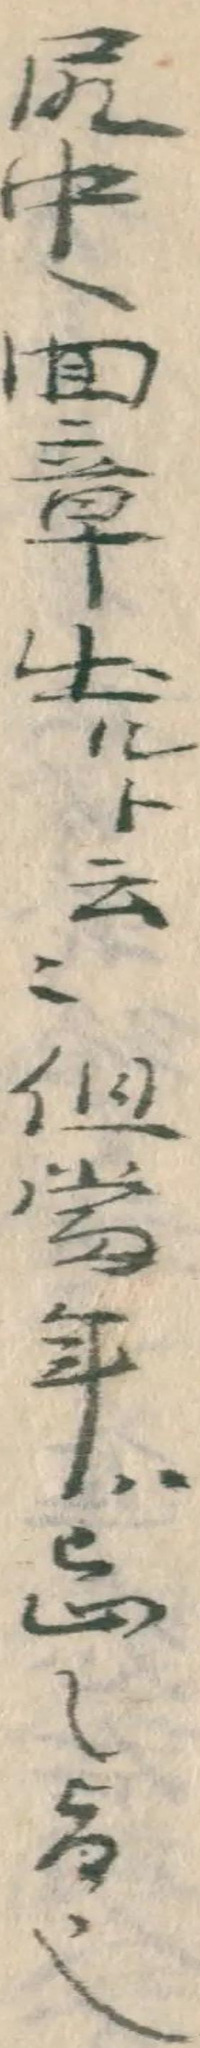尻中へ回章出ルト云々但当年ハ被止之旨也
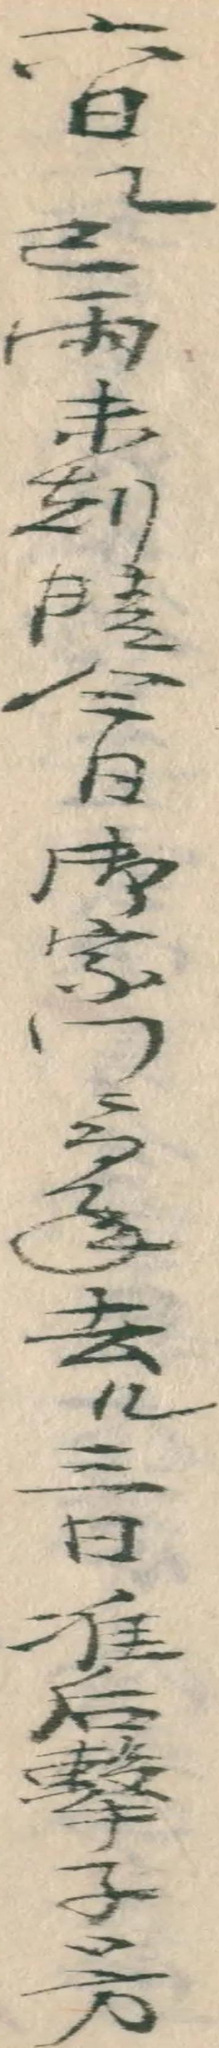六日乙巳雨未刻晴今日御家門ニ而承去ル三日准后撃子御方
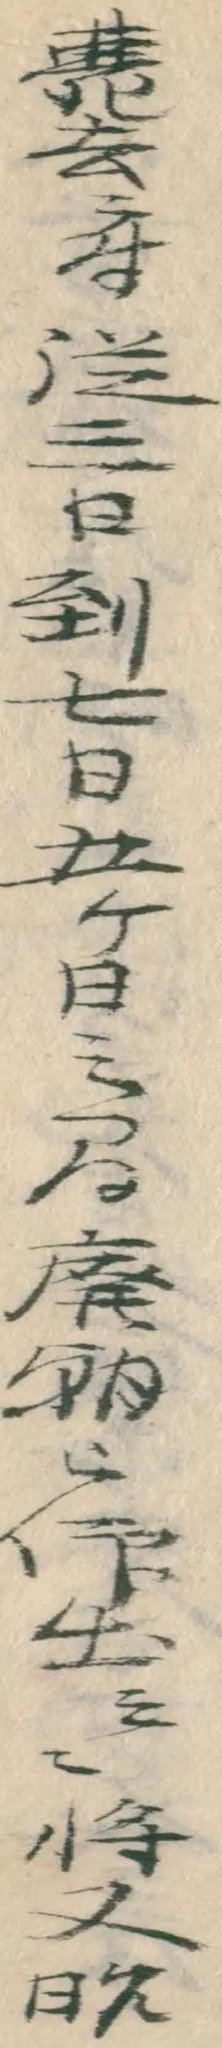薨御ニ付従三日到七日五ケ日之間廃朝被仰出云々将又昨
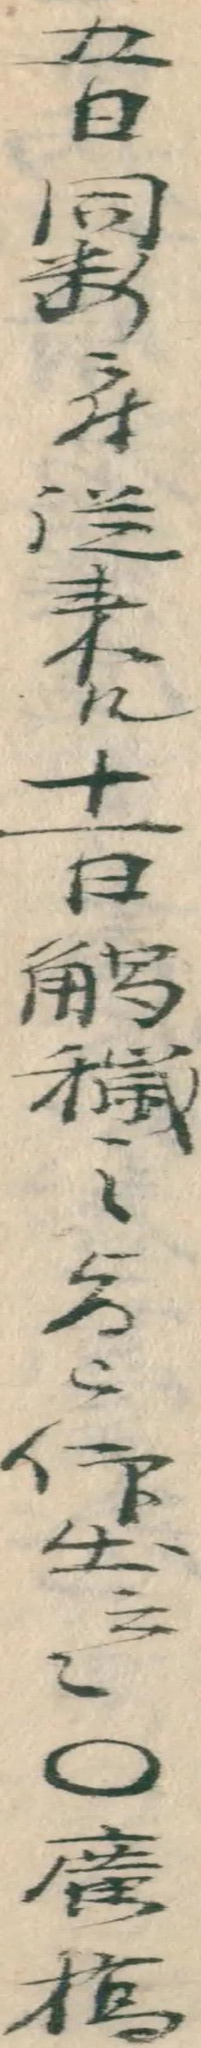五日同断ニ付従来ル十一日触穢之旨被仰出云々〇広橋
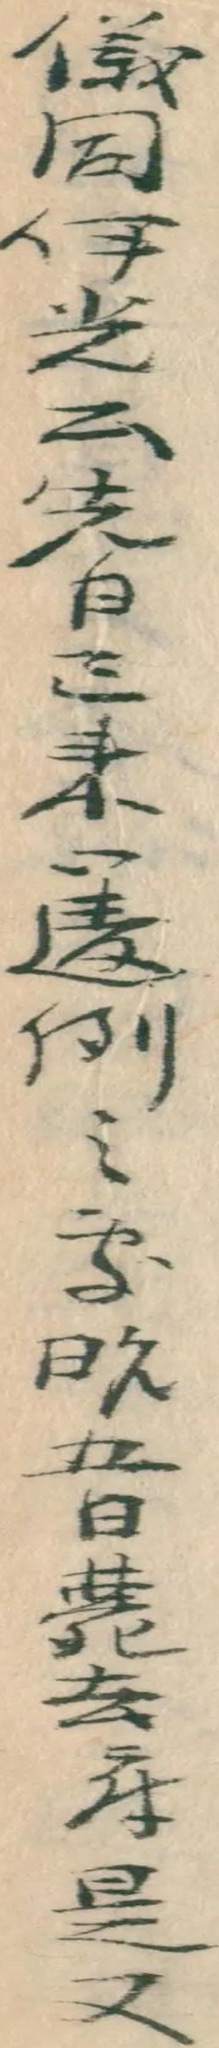儀同伊光公先日己来御違例之処昨五日薨御ニ付是又

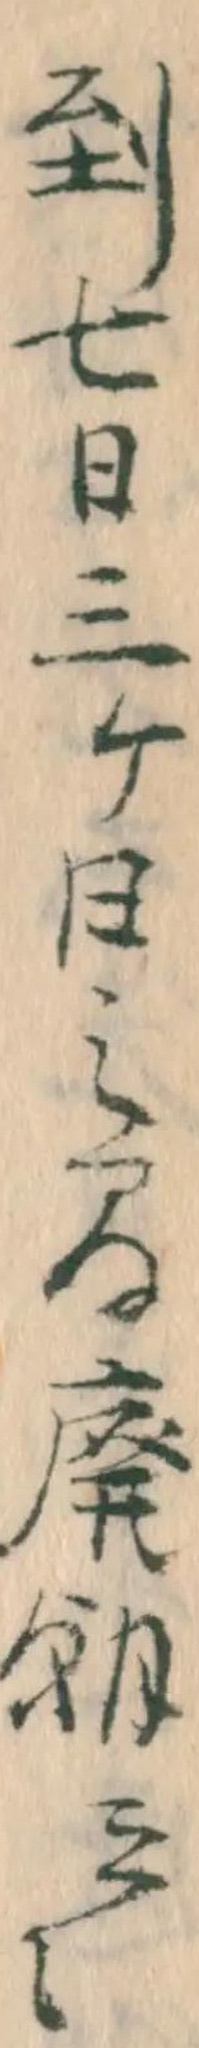到七日三ヶ日之間廃朝云々
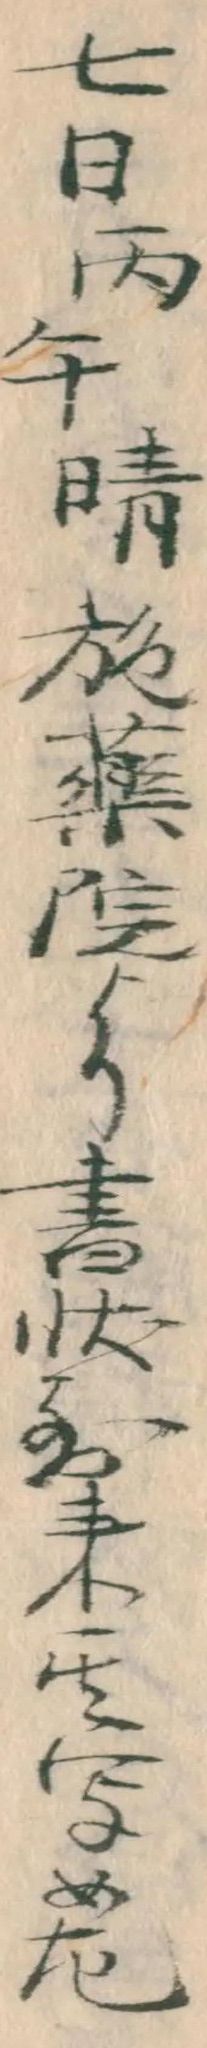七日丙午晴施薬院より書状到来其写如左
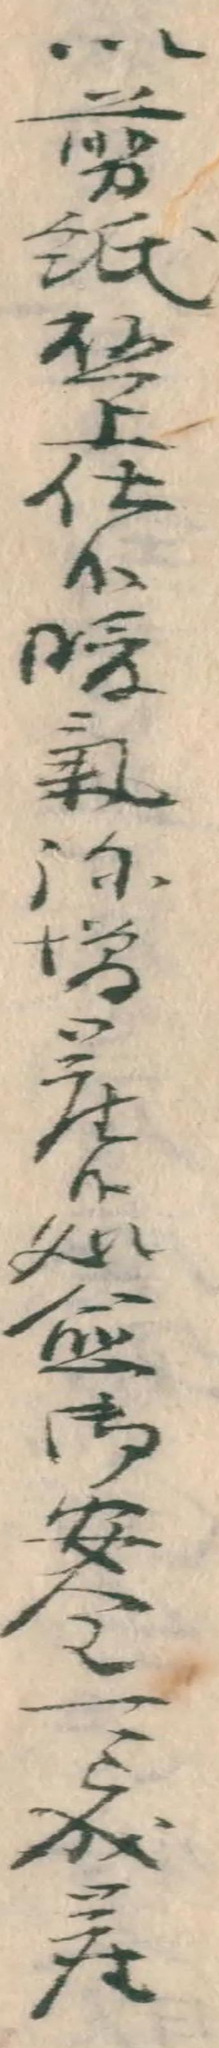以剪紙啓上仕候暖気弥増御座候処愈御安全可被成御座
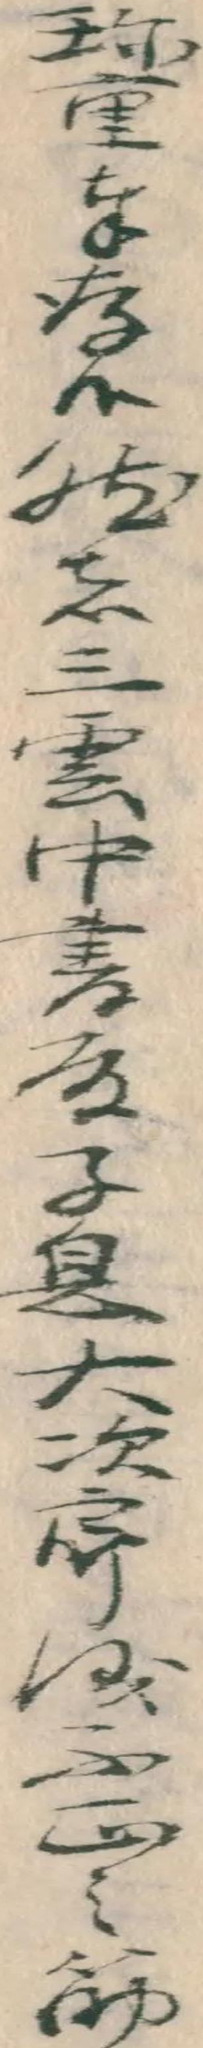珍重奉存候然者三雲中書殿子息大次郎儀不正之筋
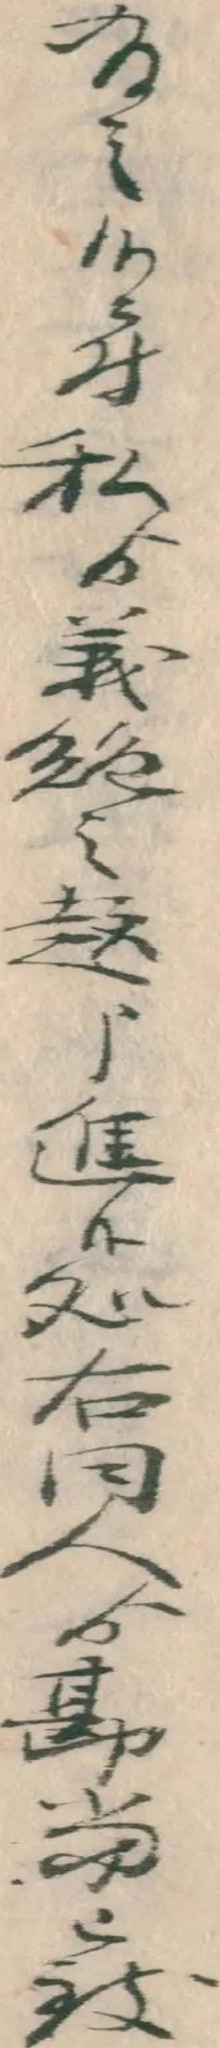有之候ニ付私ゟ義絶之趣申進候処右同人ゟ勘当被致
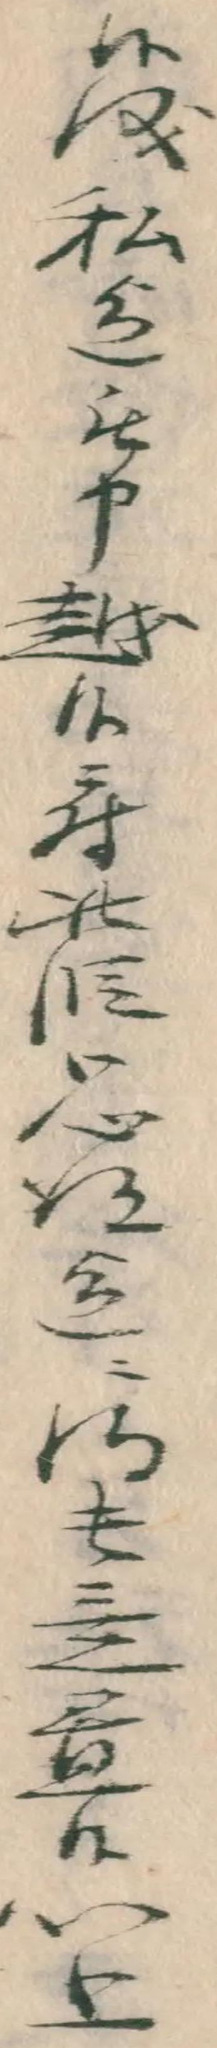候儀私迄被申越候ニ付此段御心得迠ニ得貴意置候以上
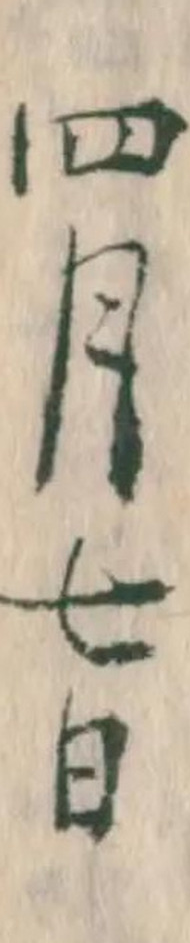四月七日
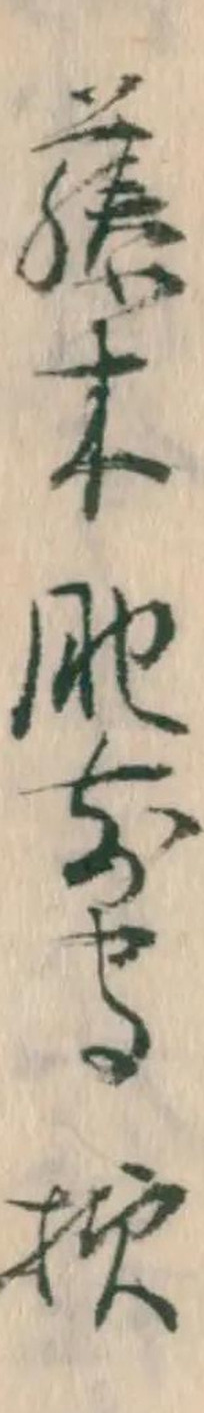藤木肥前守様
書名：賀茂社記録. 第64冊
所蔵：国立国会図書館 National Diet Library, JAPAN
